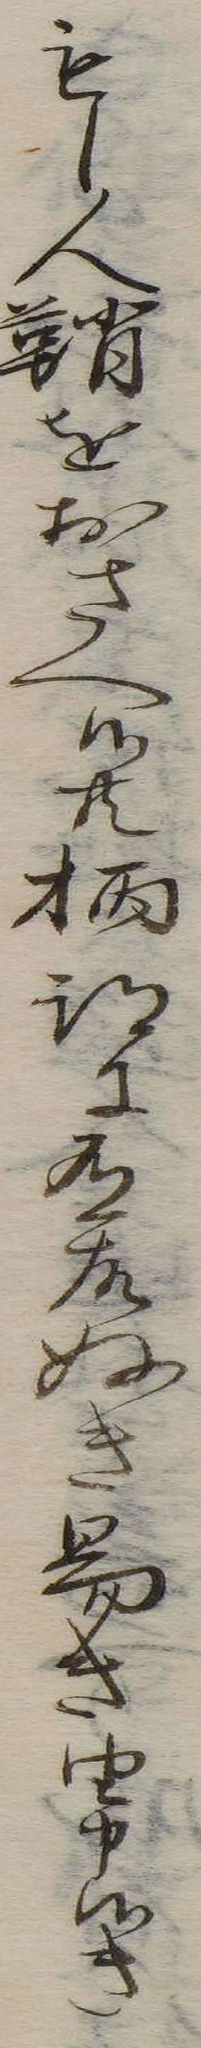もし人鞘をおさへ候共柄跡に有故ぬき易き由申候き
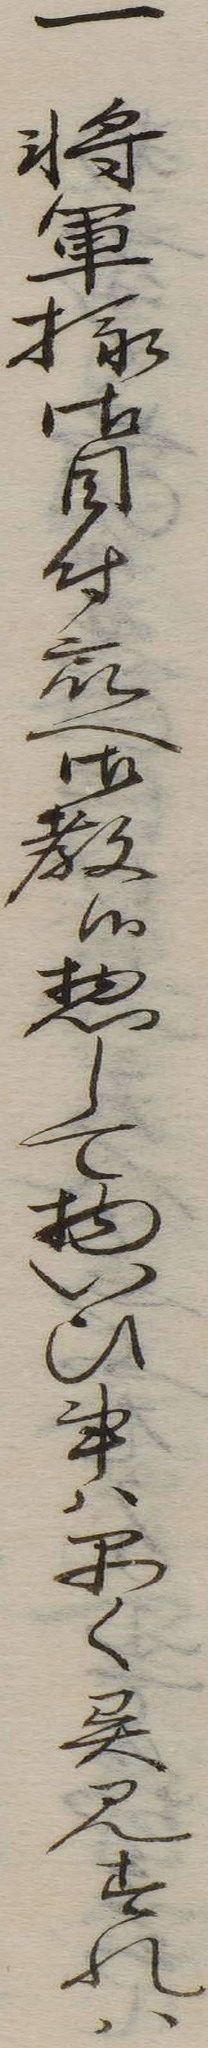一将軍様御目付衆へ御教候惣して物いひ事は早く異見すれは
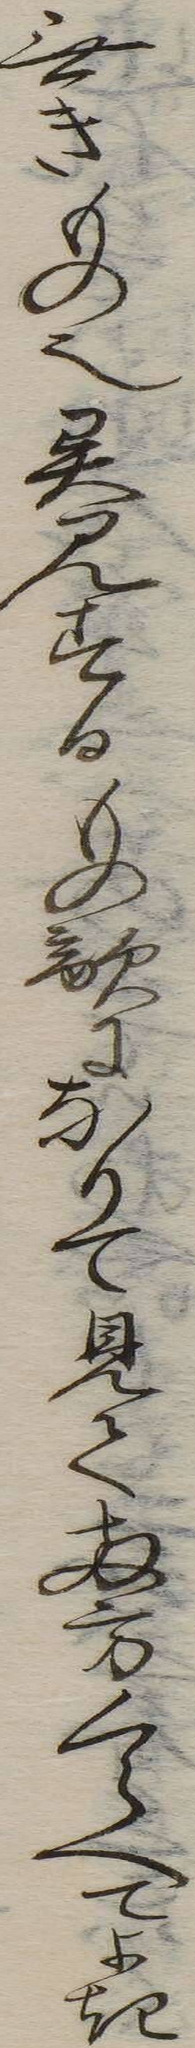無きもの也異見するもの敵になりて見て両方くらへてよき
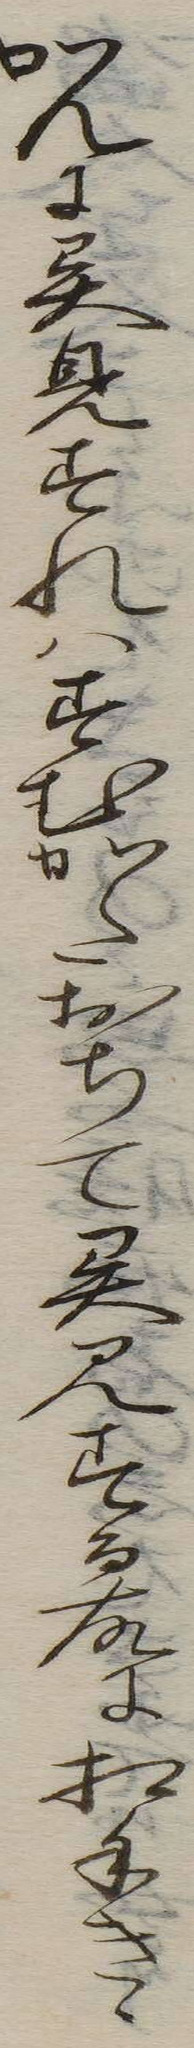かんに異見すれはすむかたおちて異見する故に相手きゝ
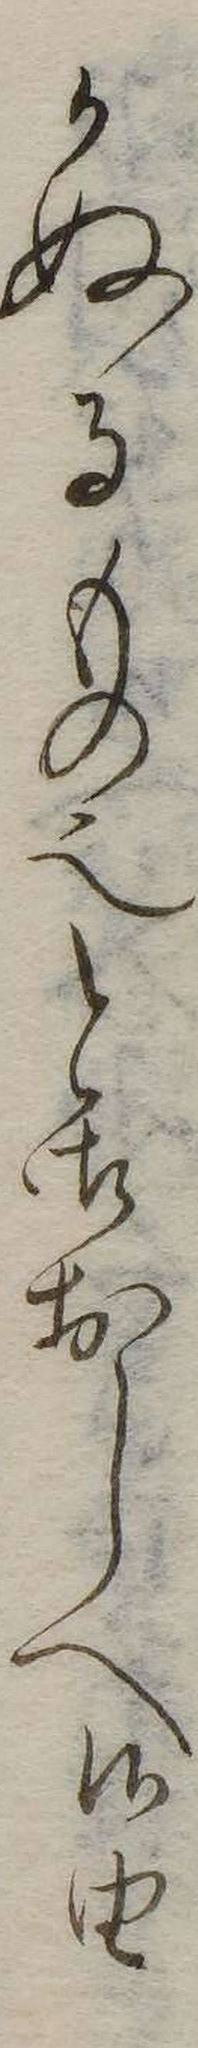かぬるもの也と御おしへ候由
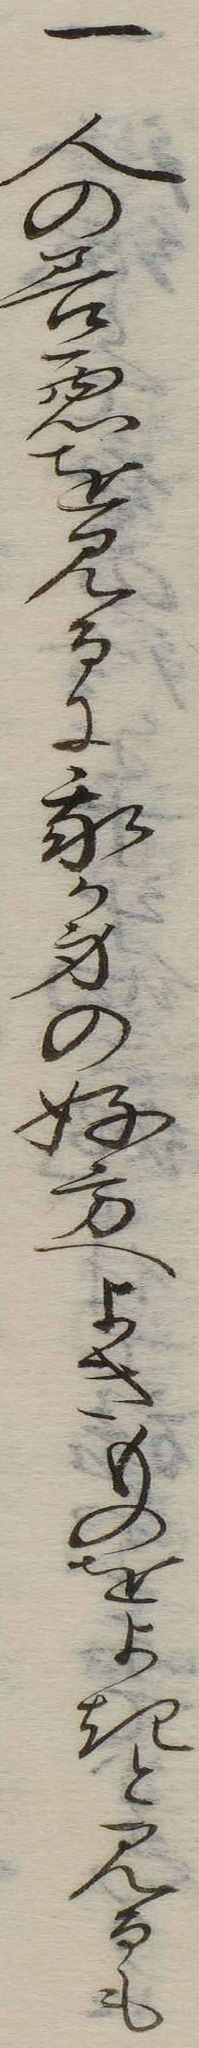一人の善恵を見るに我か身の好方へよきものをよきと見るも
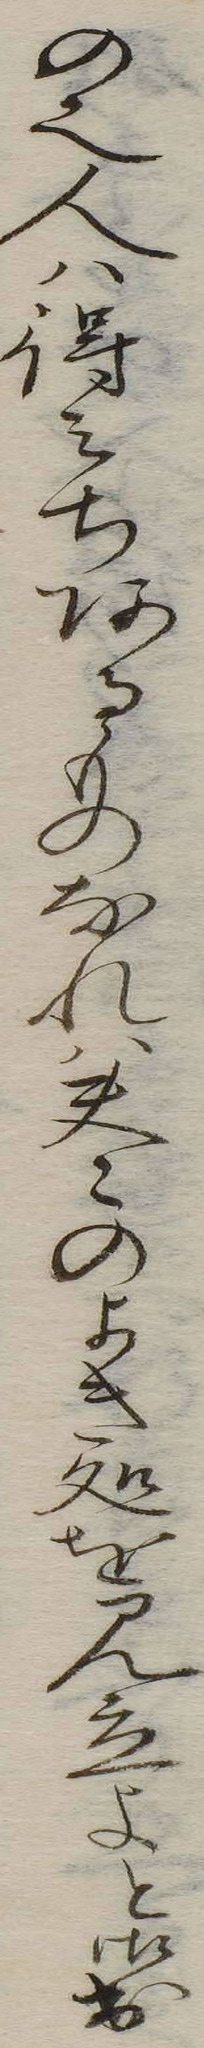の也人は得みちあるものなれは夫々のよき処を見立よと御お
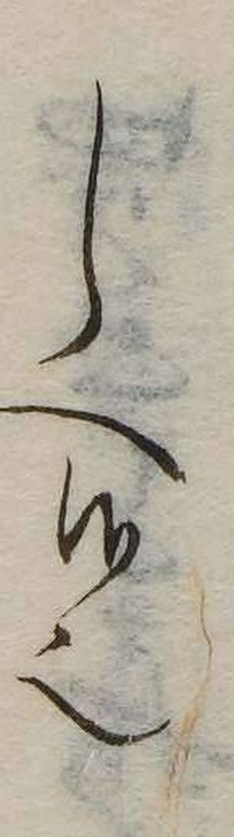しへ候也
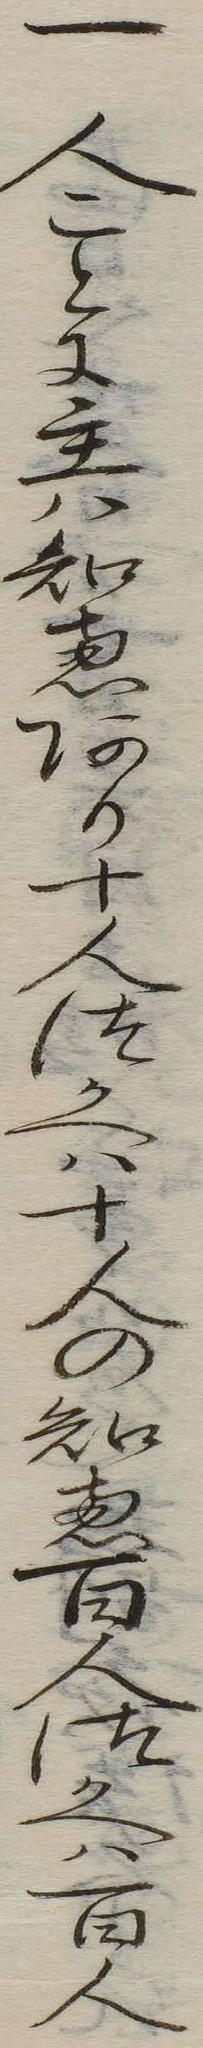一人ことに主は知恵あり十人つかへは十人の知恵百人つかへは百人
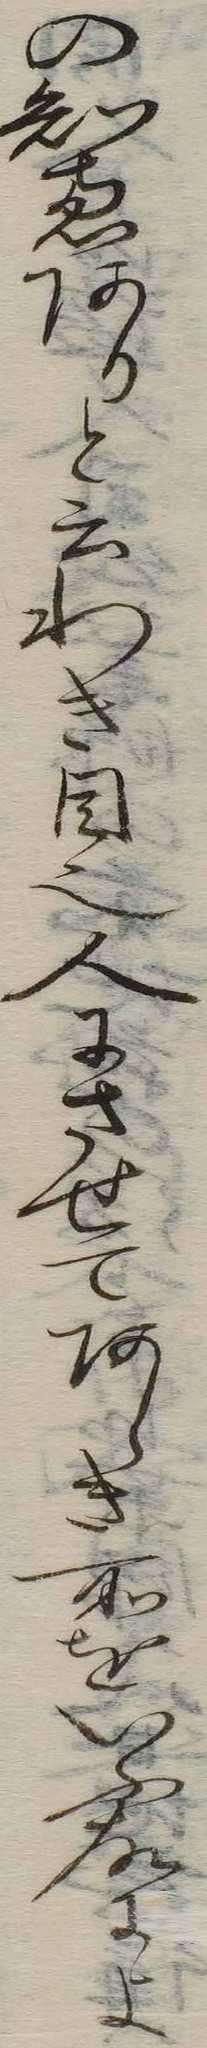の知恵ありと云わき目也人にさせてあらき所をいふ故によ
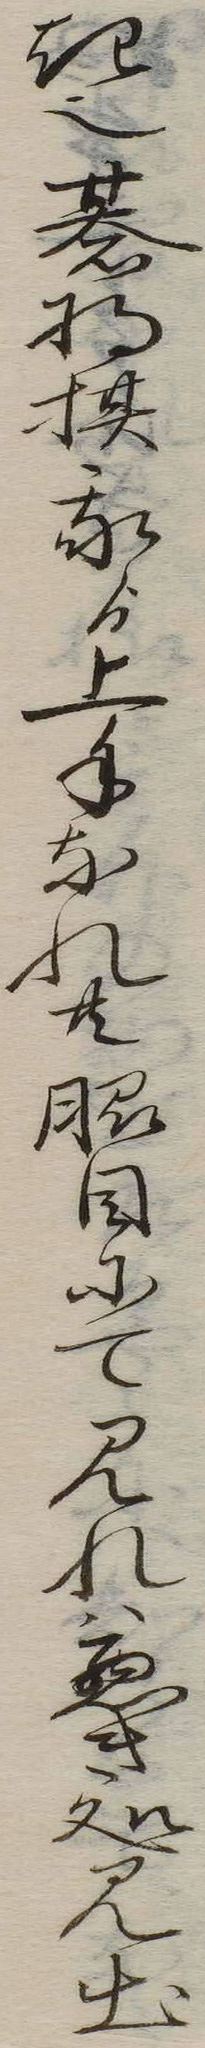き也碁将棋我ゟ上手なれ共脇目にて見れは悪き処見出
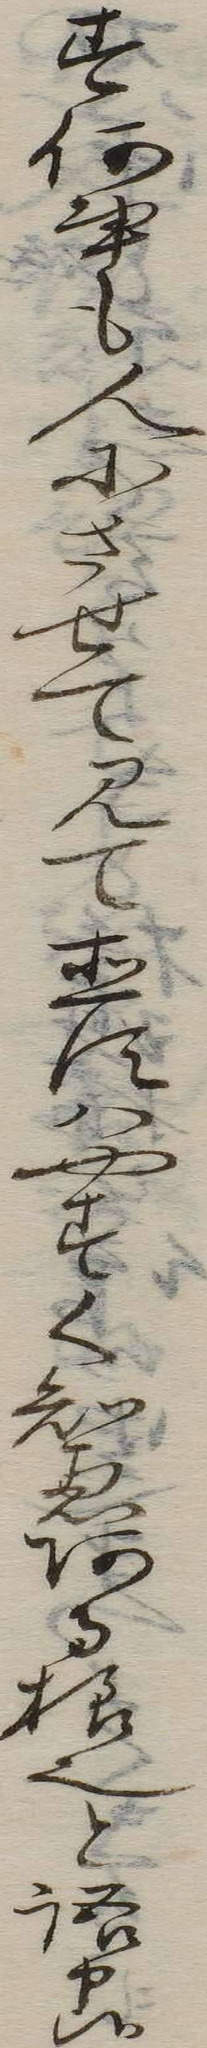す何事も人にさせて見て直すはやすく知恵ある様也と語申候
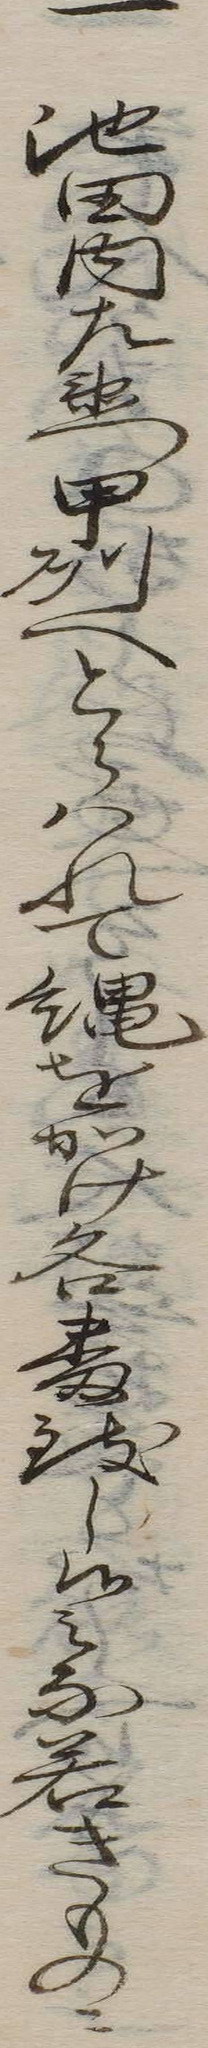一池田内左衛門甲州へとらはれて縄をかけ各番致し候みな若きものニ
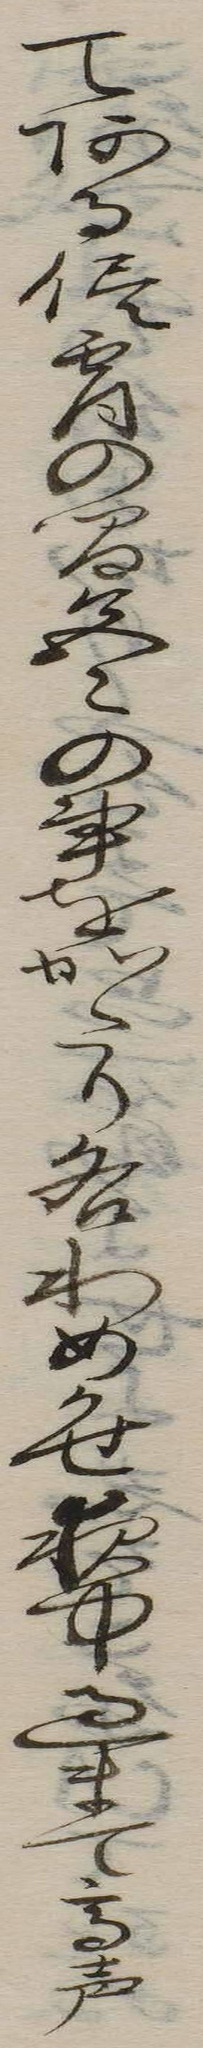てある侭宵の間色々の事をかたり各わめかせ夜中過まて高声
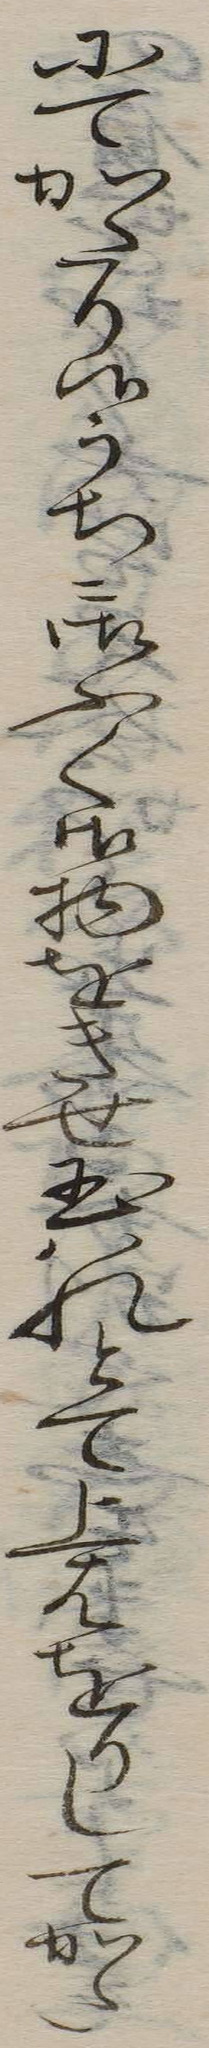にてかたり候うちに御ふく御物をきせ玉はれとて上はをりしてかた
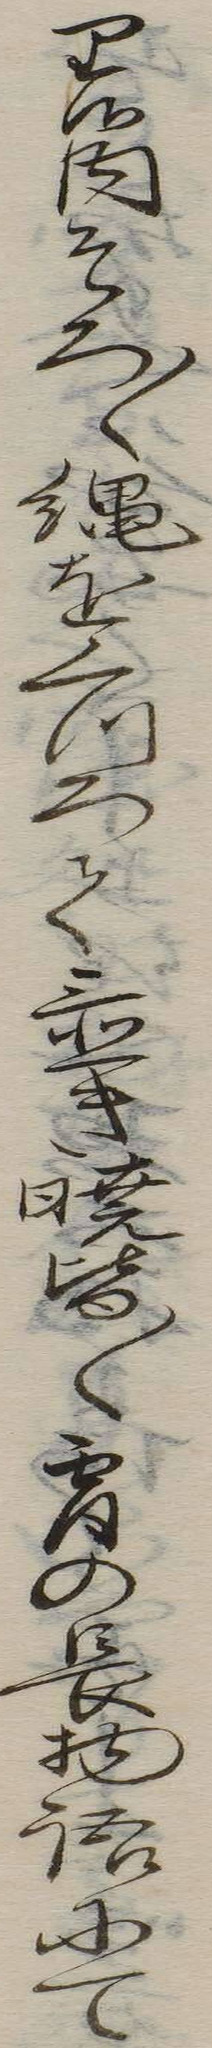り候内そろ〳〵縄をくつろて置き暁皆〳〵宵の長物語にて
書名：三河之物語
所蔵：国文学研究資料館
